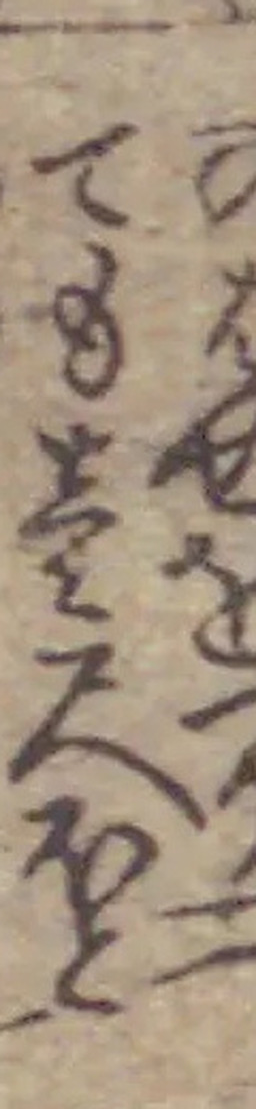ても壱尺ほと
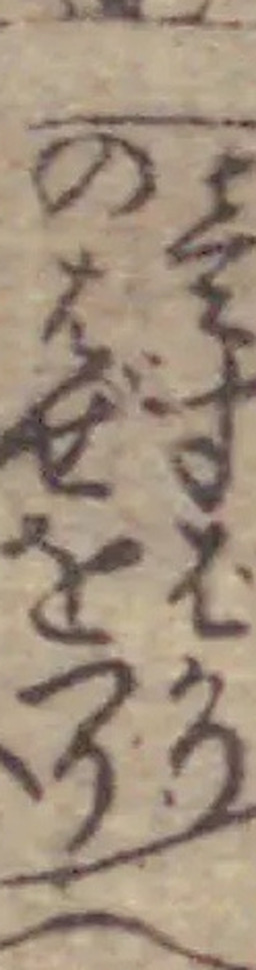のはぜをつり
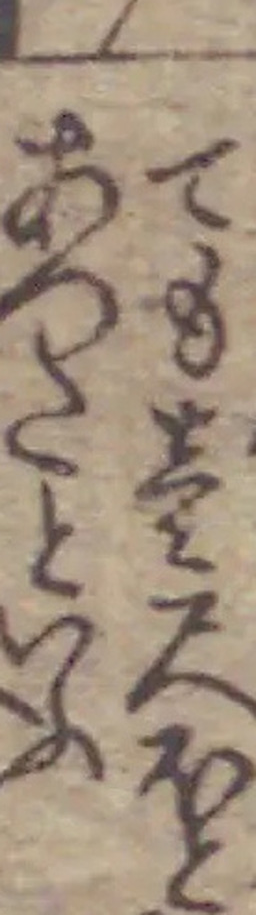あつたといふ
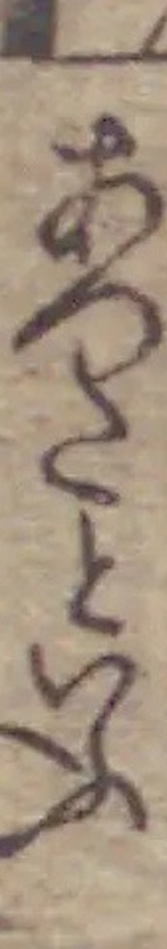あつたといふ

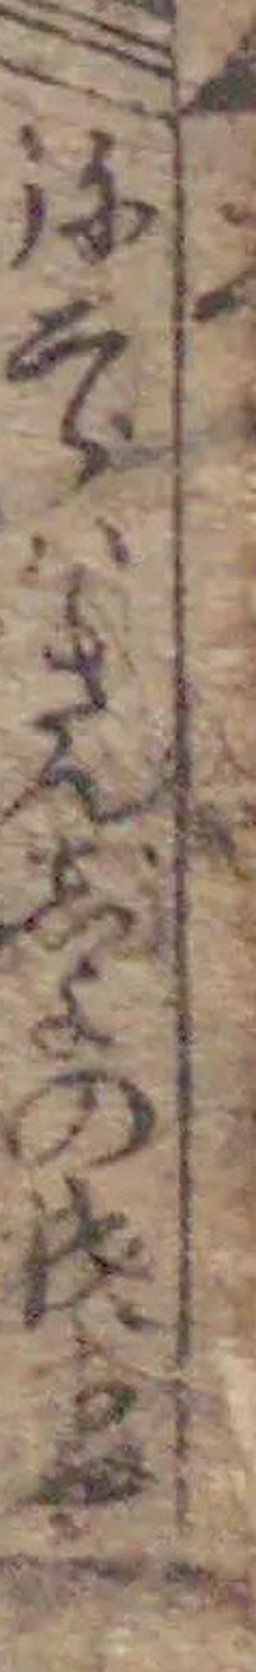弥二郎はきんしよの材木や
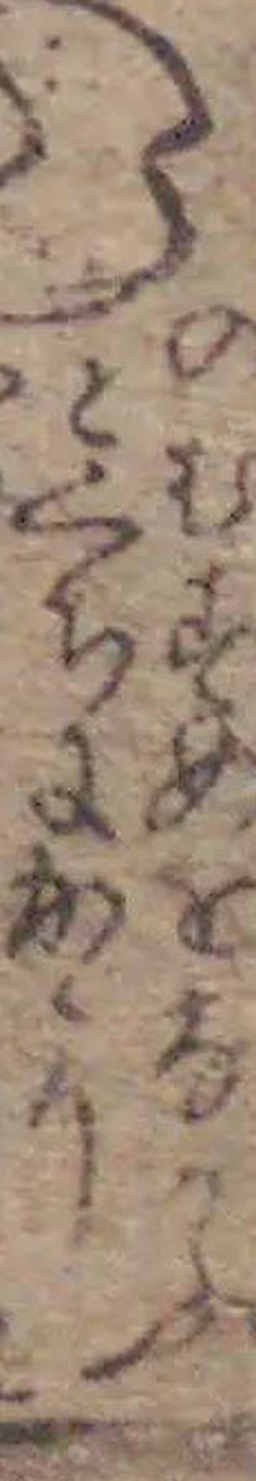とくちにかゝり
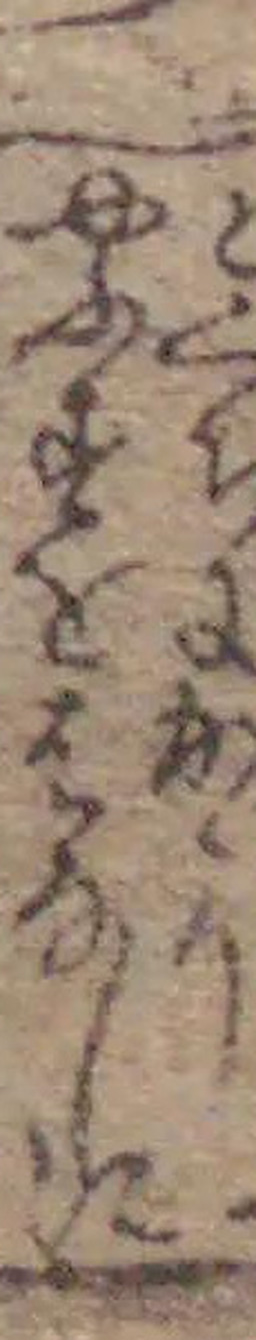やふすをはなしに
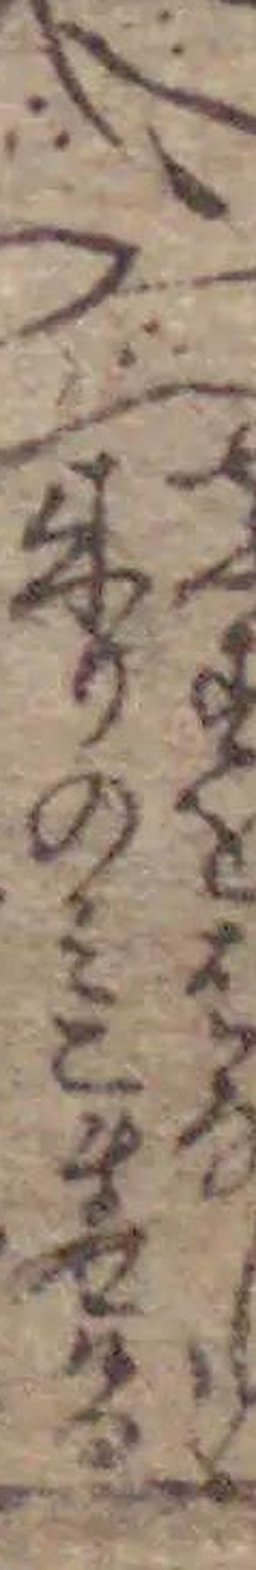来りのみこませける
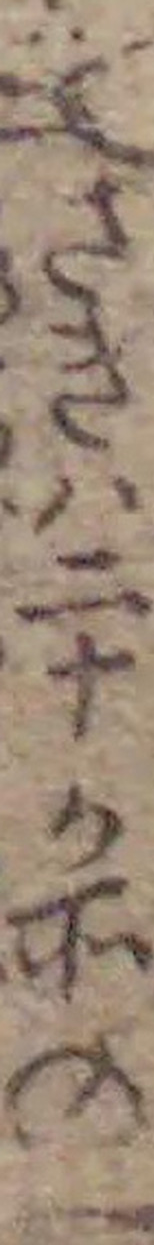さきは二十が所の
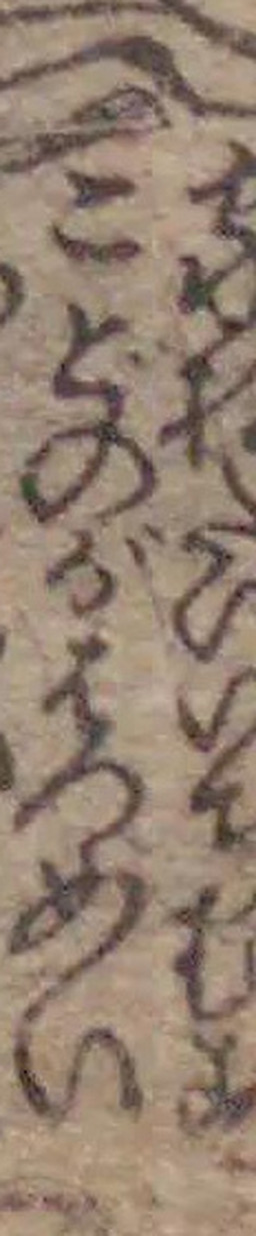こどのがはつめい
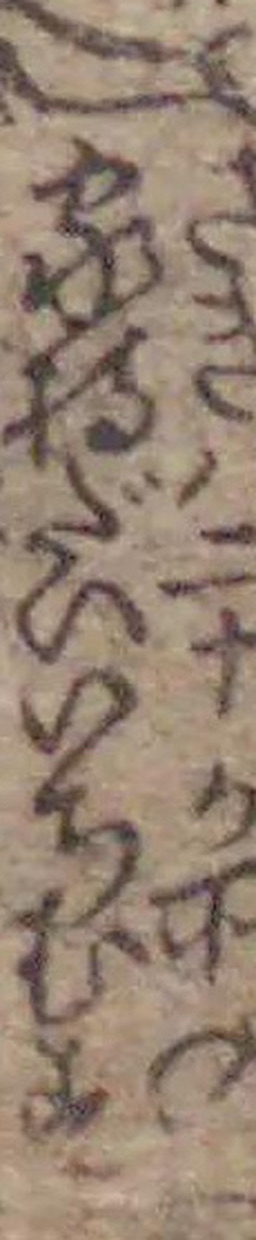家持だいいちむす
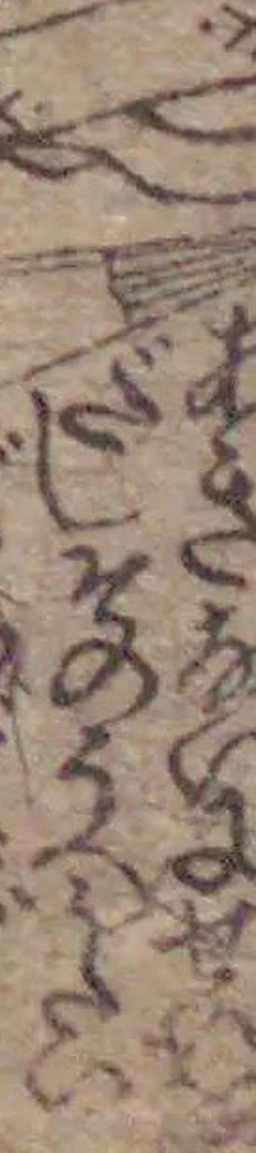だしそのうへうたい
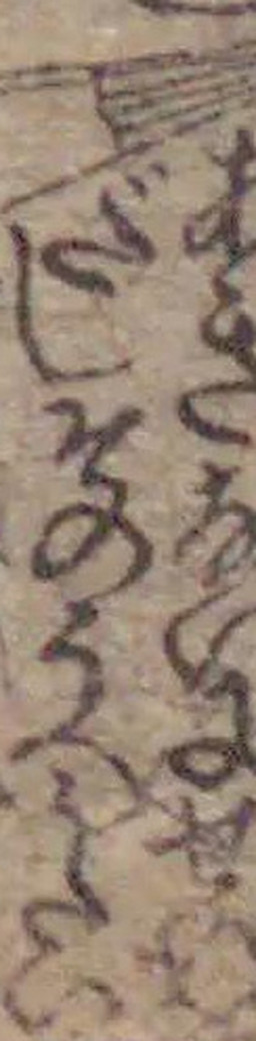だしそのうへうたい
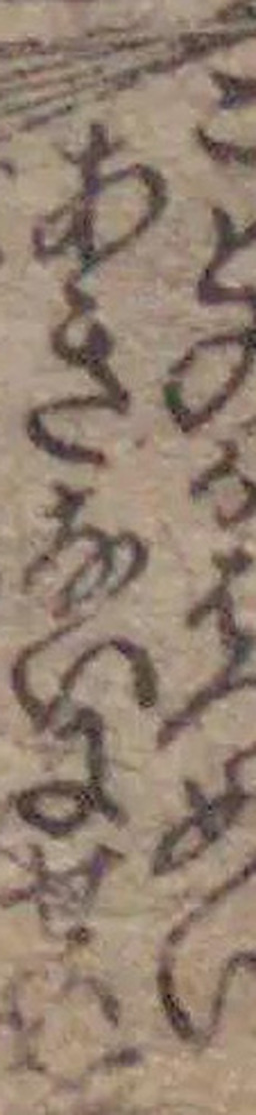あきないにせい
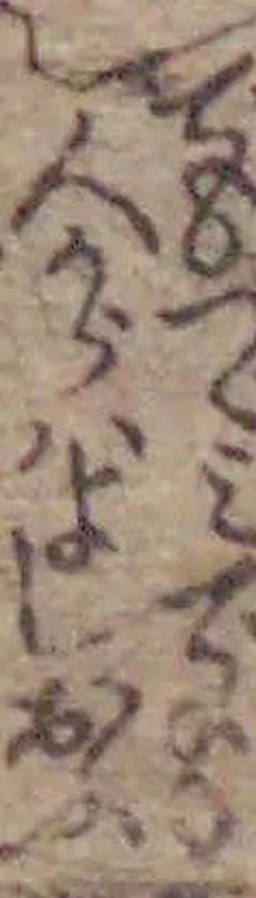人からはよしおふ
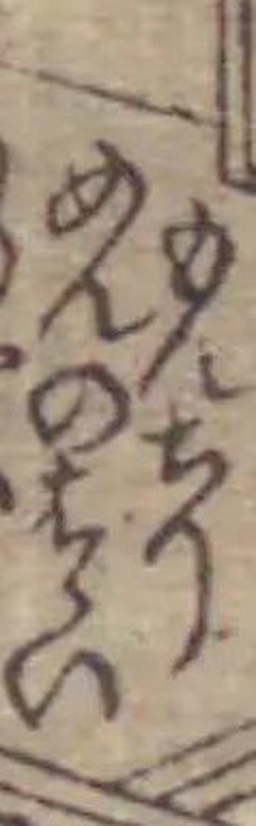めんのはらい
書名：虚言弥二郎傾城誠 3巻
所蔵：国立国会図書館 National Diet Library, JAPAN
